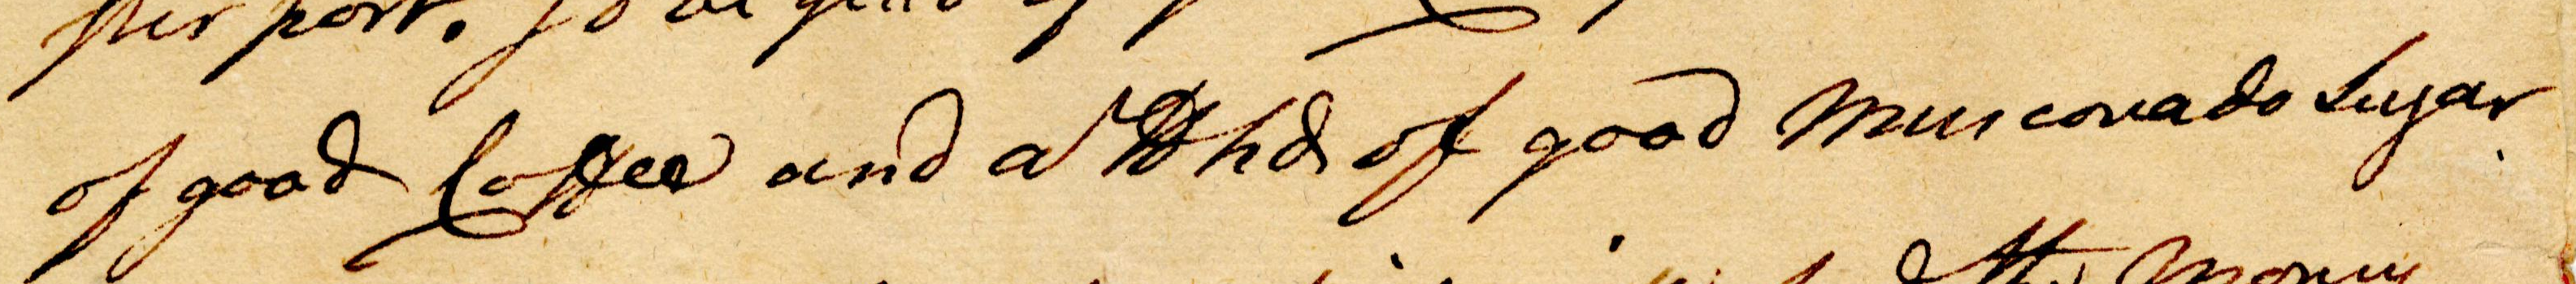of good Coffee and a Hhd of good Muscavado Sugar
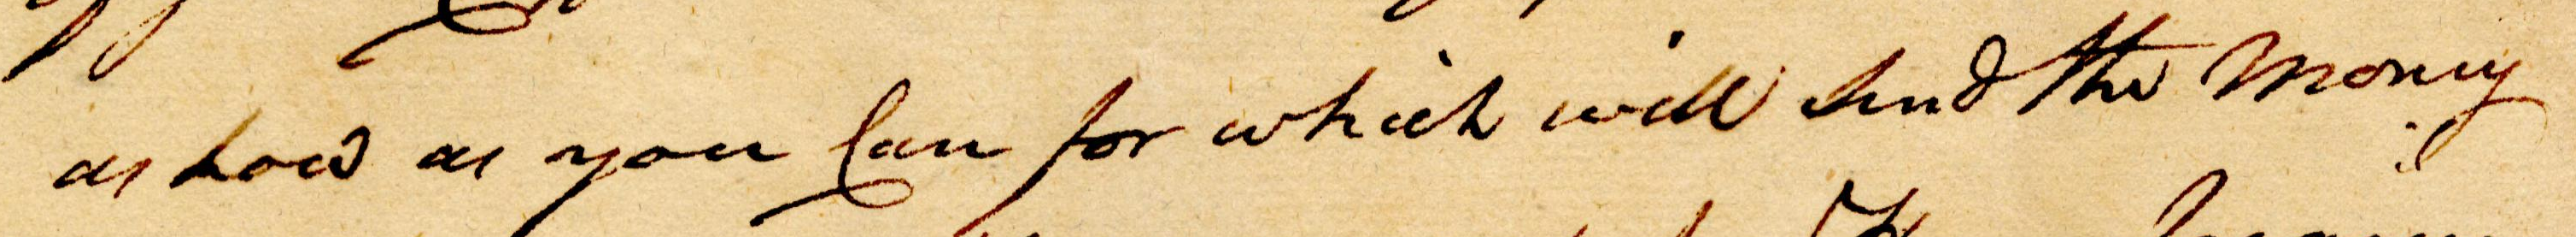as Low as you Can for which will send the money
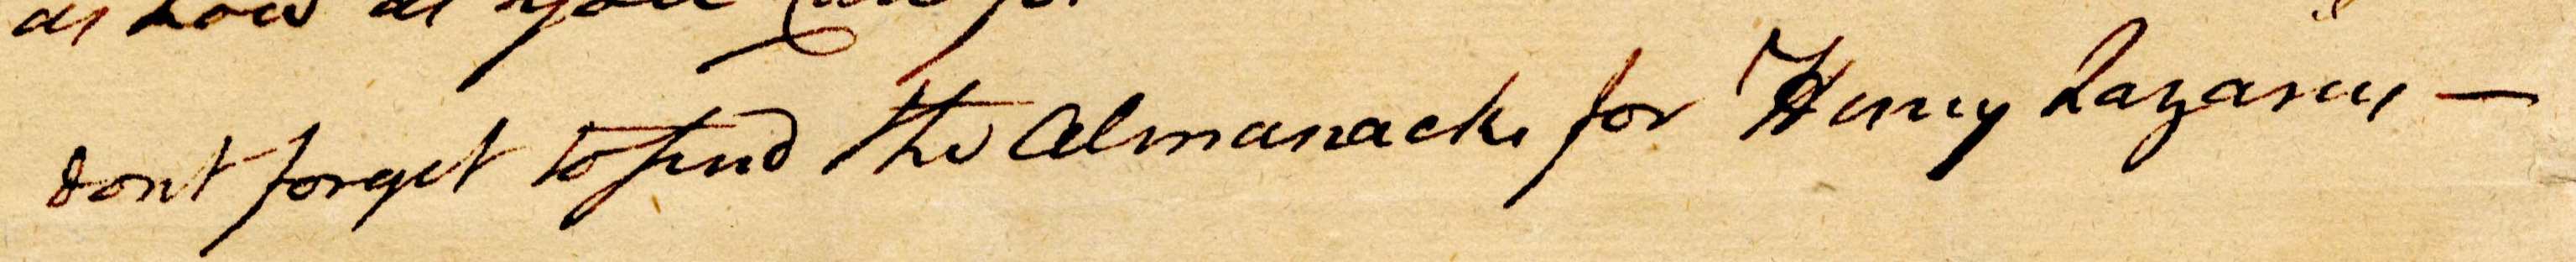dont forget to send the Almanack for Henry Lazarus-
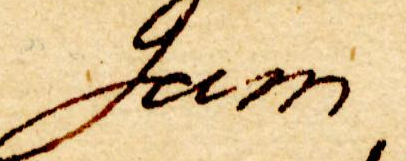I am
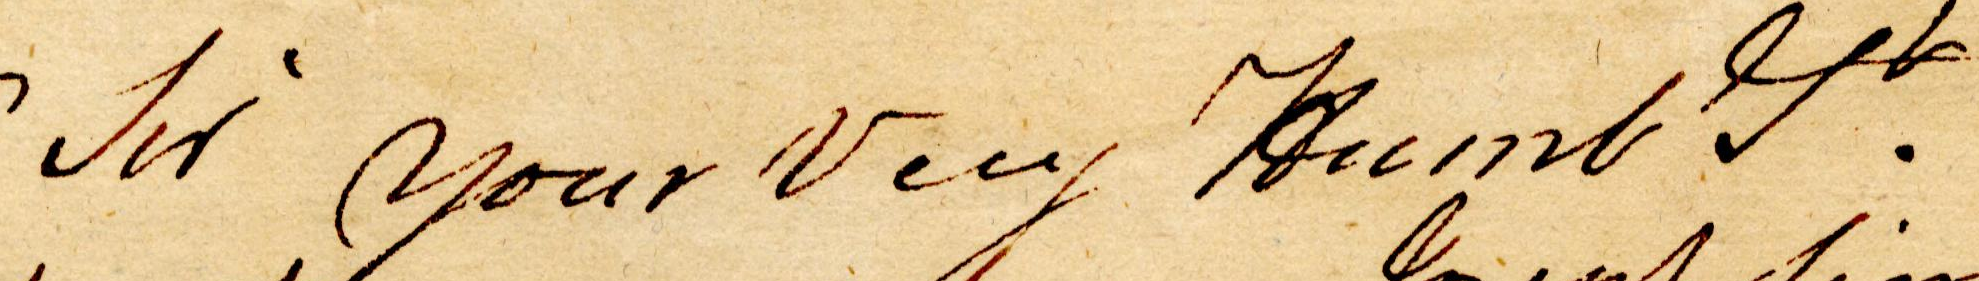Sir Your Very Humb S^t.
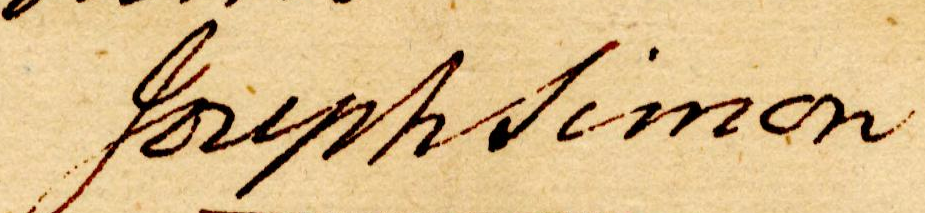Joseph Simon
